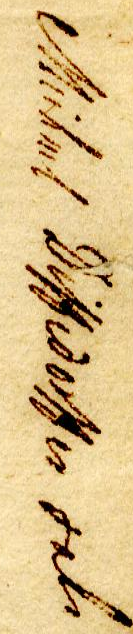Michael Diffedoffer & also
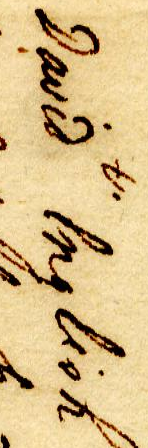David English
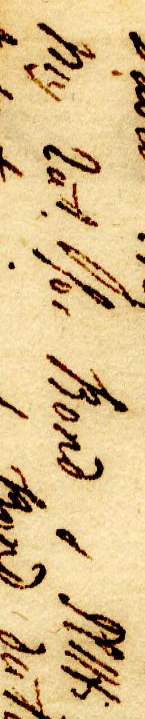My lat. for Bond & Pllll
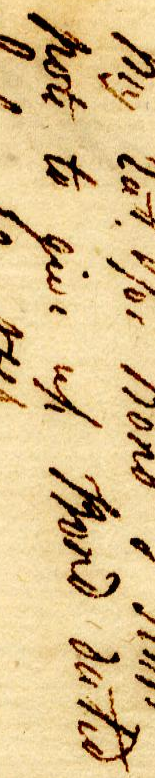note to give up Bond duted
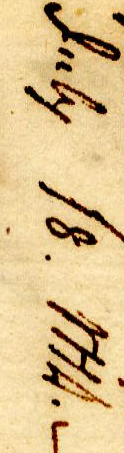July 18^th. 1774.
